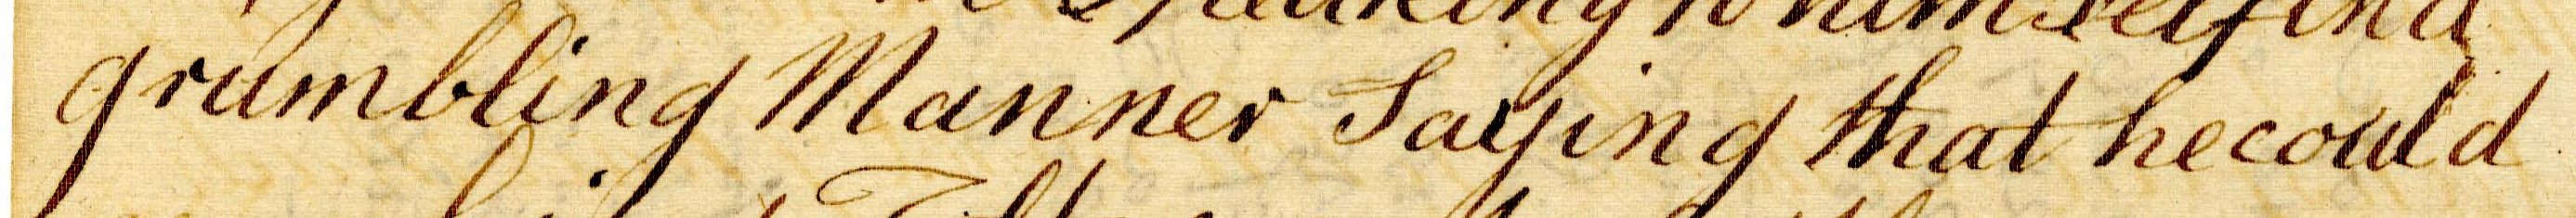grumbling Manner Saying that he could
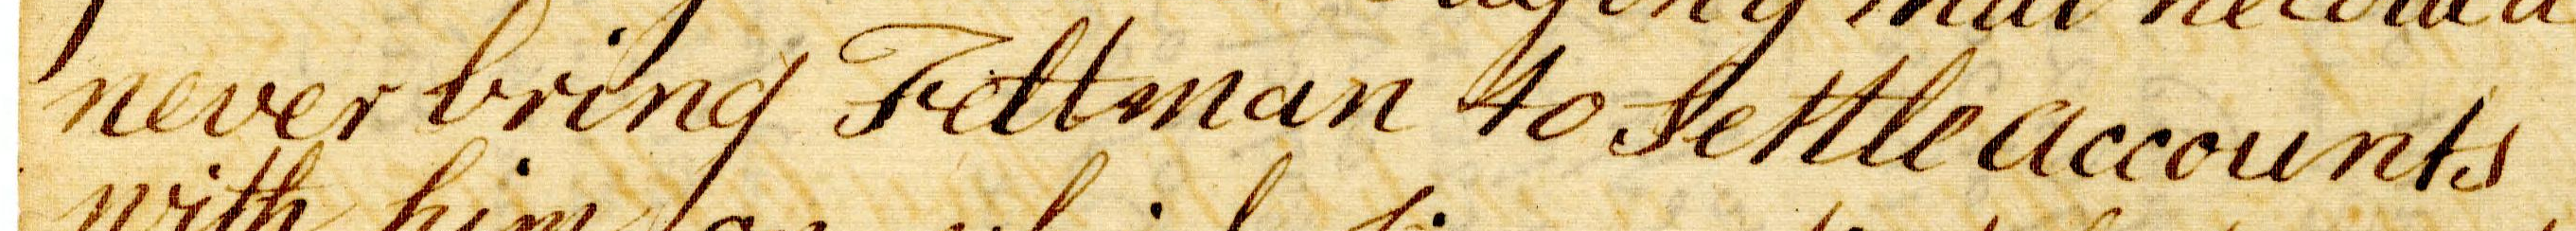never bring Feltman to Settle accounts
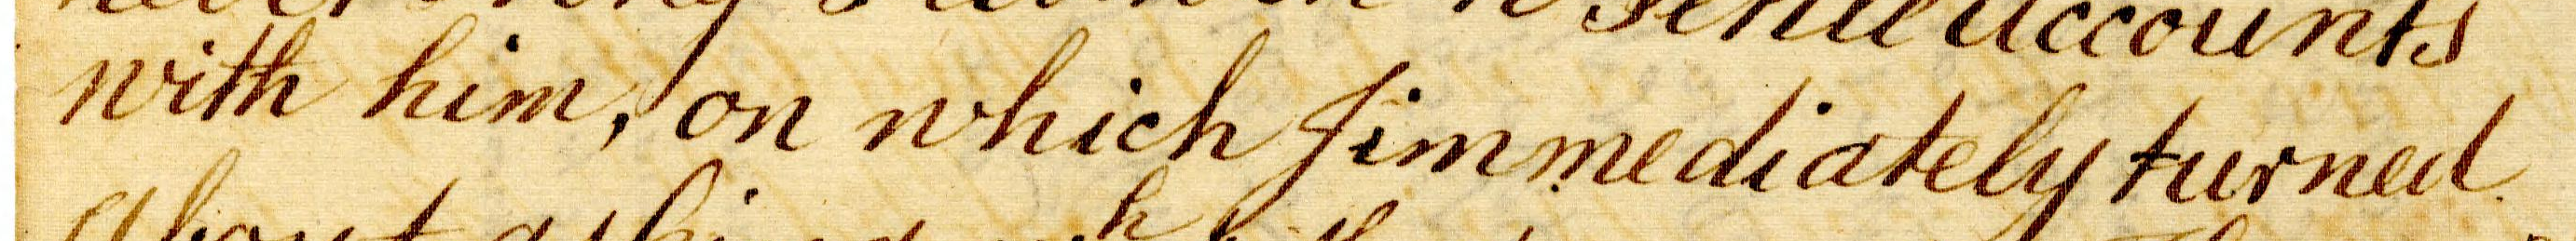with him, on which I immediately turned
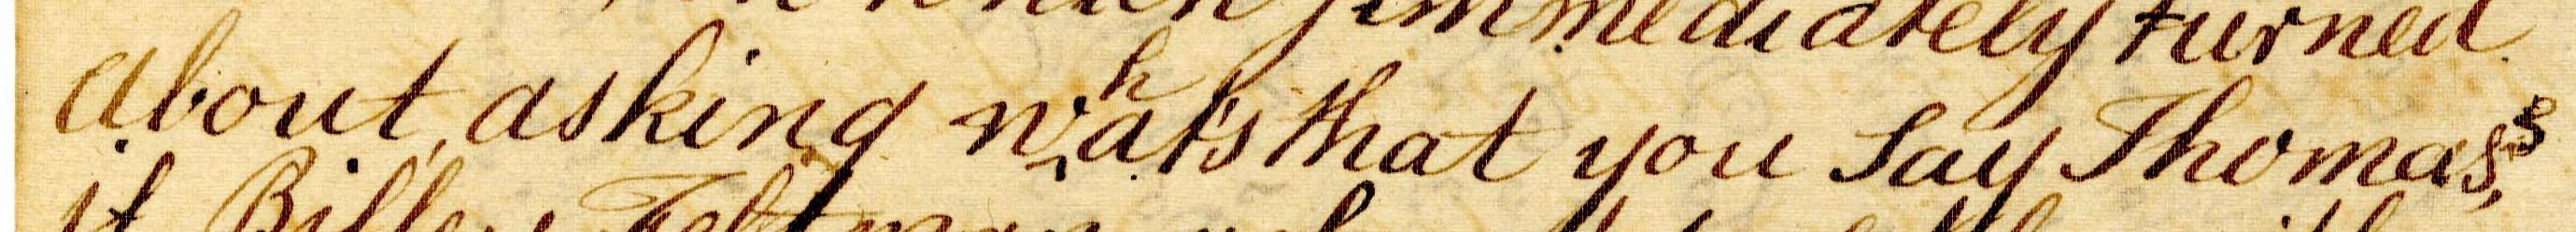About, asking w^at's that you say Thomas,
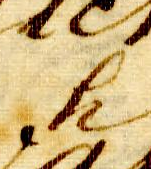h
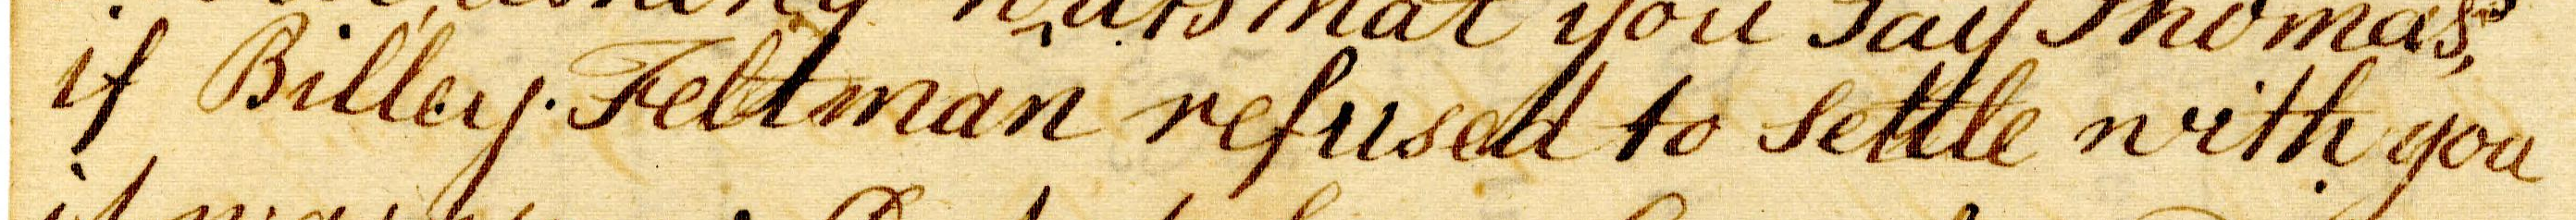if Billey Feltman refused to settle with you
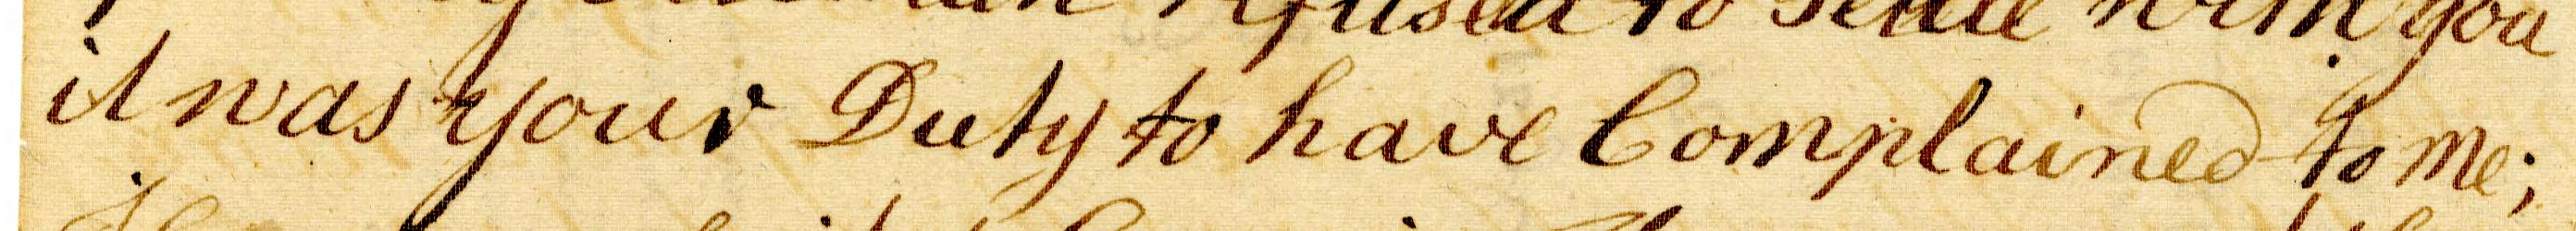it was your Duty to have Complained to me;
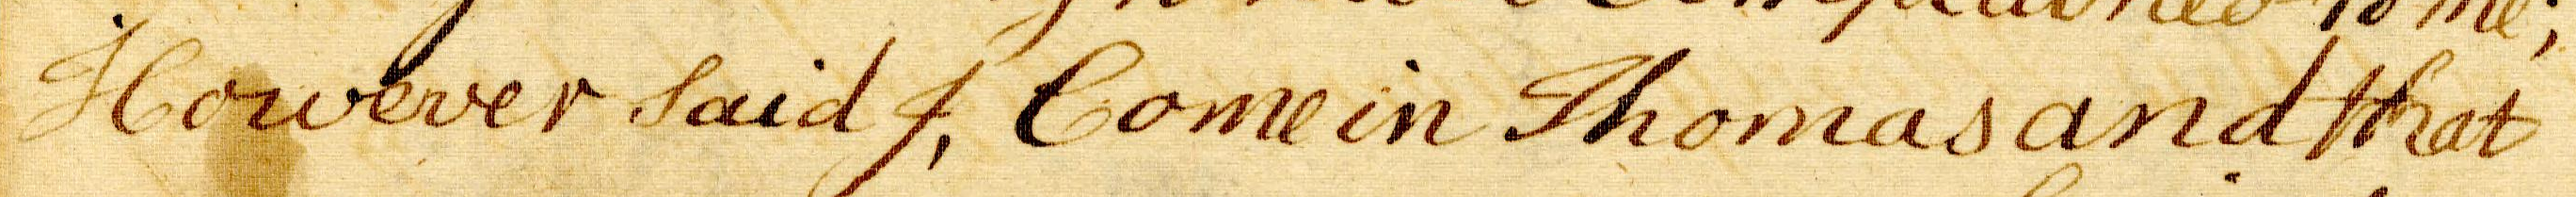However said I, Come in Thomas and that
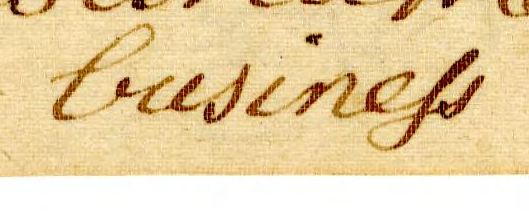business
